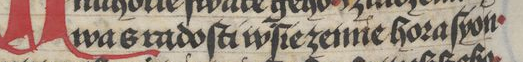wa sradoſtí wẛíe zemie hora ſyon.
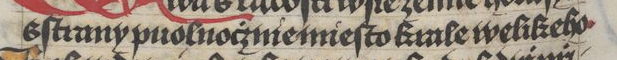sſtrany puolnocžnie mieſto krale welikeho.
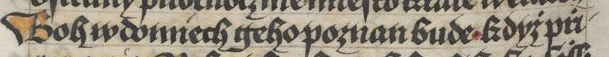Boh w domíech geho poznan bude.když při¬
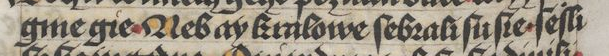gme gie.Neb ay kralowe ſebrali ſu ſie.ſeẛli
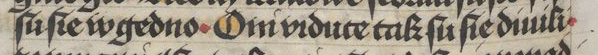ſu ſie w gedno.Oni viduce tak ſu ſie díuili.
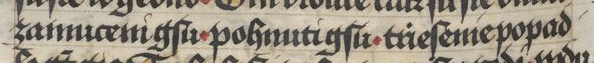zamuceni gſu.pohnuti gſu.tṙieſeníe popad¬
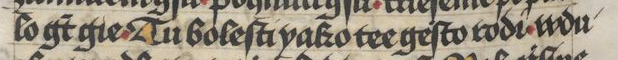lo ḡt gie.Tu boleſti yako tee geẛto rodi.wdu¬
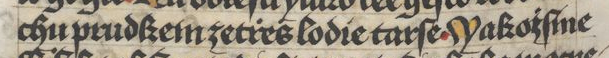chu prudkem zetṙes lodíe tarſe.Yakożſme
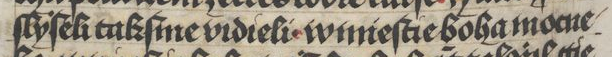ſlyẛeli takſme vidieli.wmieſtie boha mocne¬
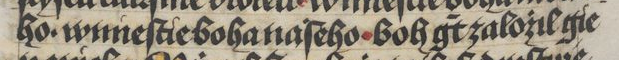ho.wmieſtie boha naẛeho.boh ḡt založil gie
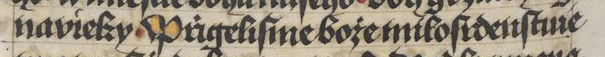navieky.Pṙigeliſme boże miloſrdenſtuíe
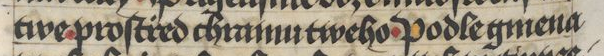twe.proſtṙed chramu tweho.Podle gmena
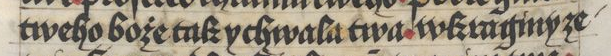tweho boŻe tak y chwala twa.wkragimy ze¬
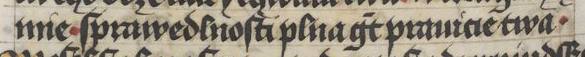mie.ſprawedlnoſti plna ḡt prauicíe twa.
